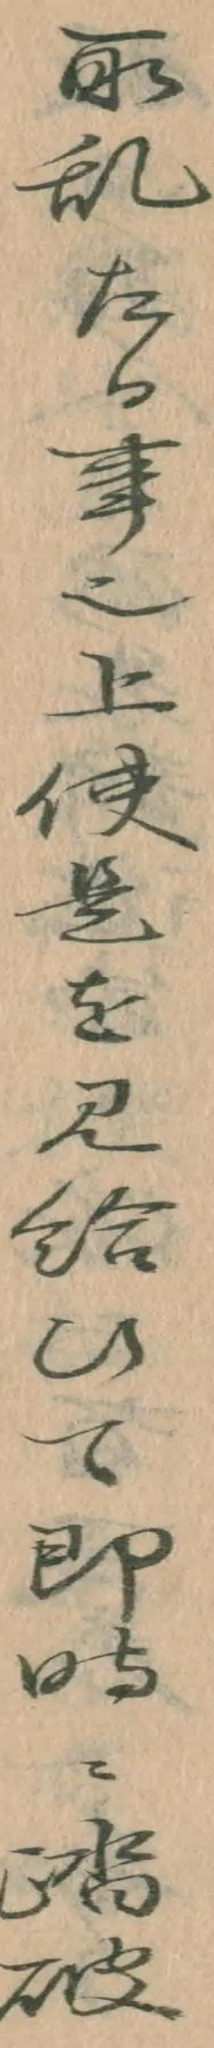取乱たる事也上使是を見給ひて即時に踏破
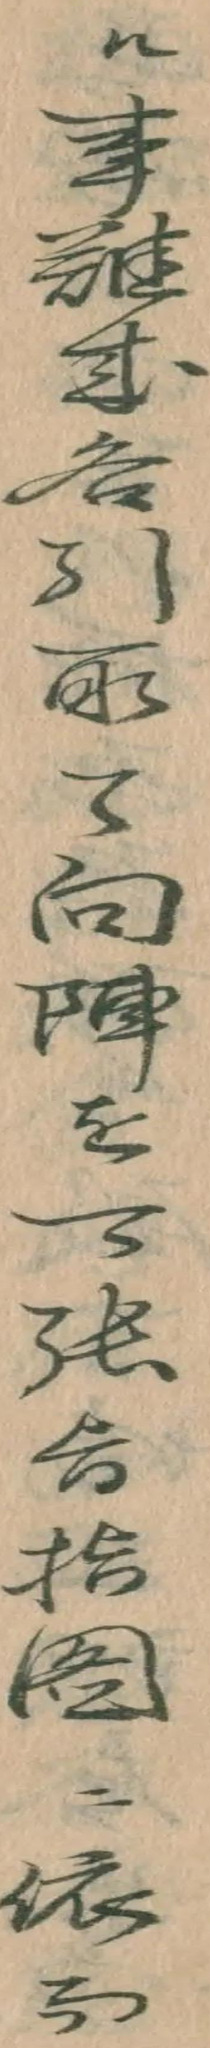候事難成角引取て向陣を可張旨指図に依而
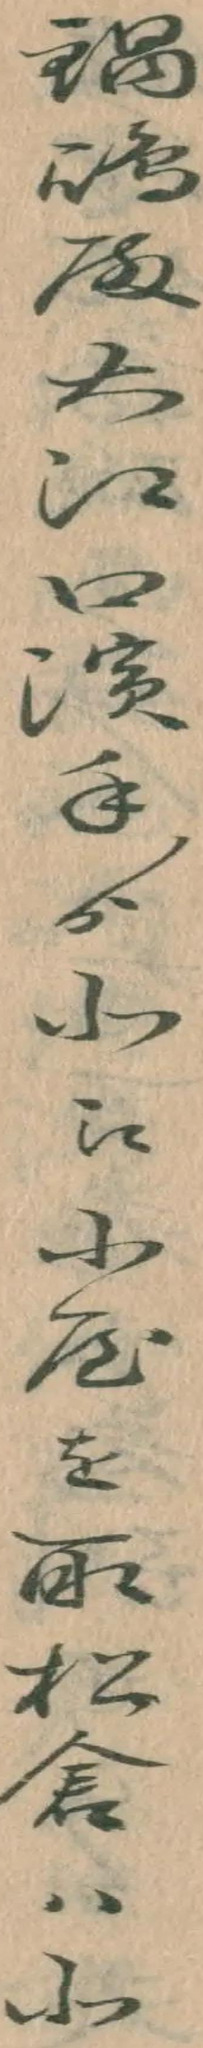鍋島殿大江口浜手ゟ北江小屋を取松倉は北
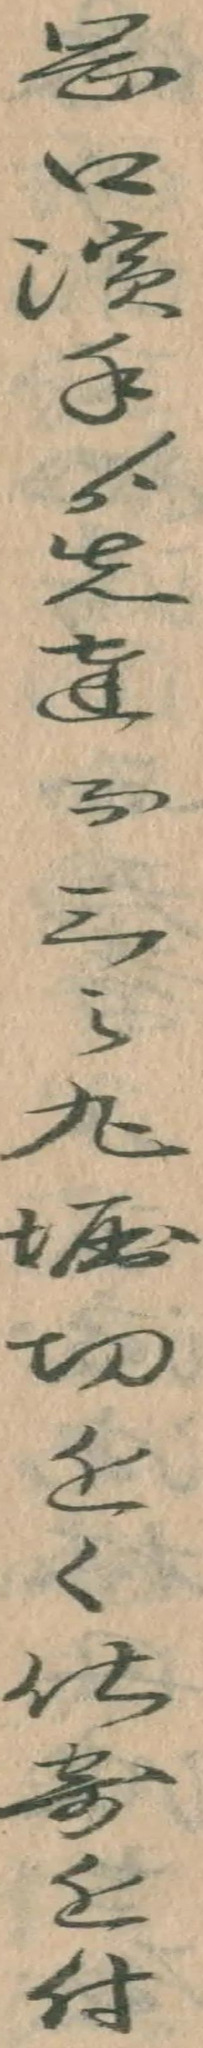岡口浜手ゟ先達而三之丸堀切近く仕寄近付
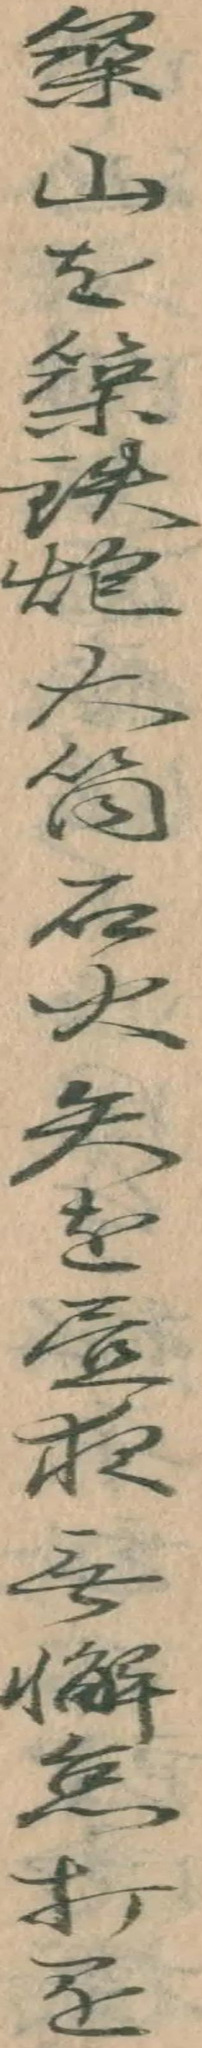築山を築鉄炮大筒石火矢を昼夜無懈怠打懸
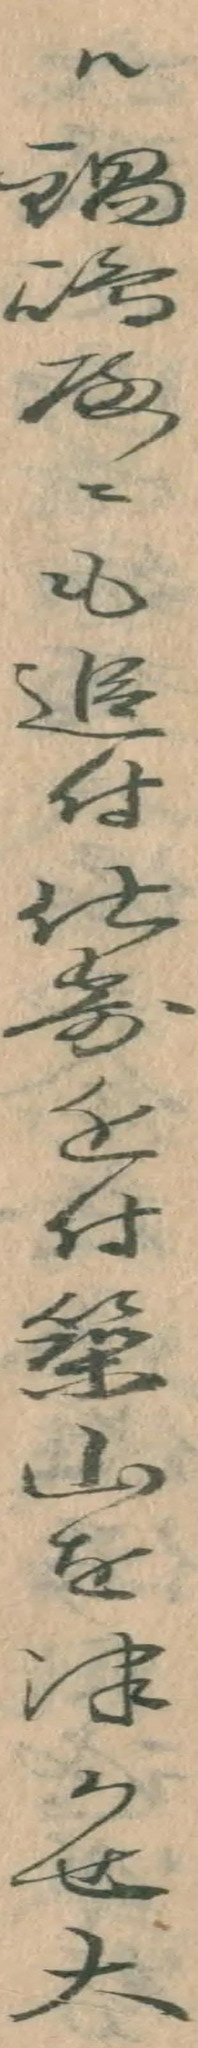候鍋島殿にも追付仕寄近付築山を津かせ大
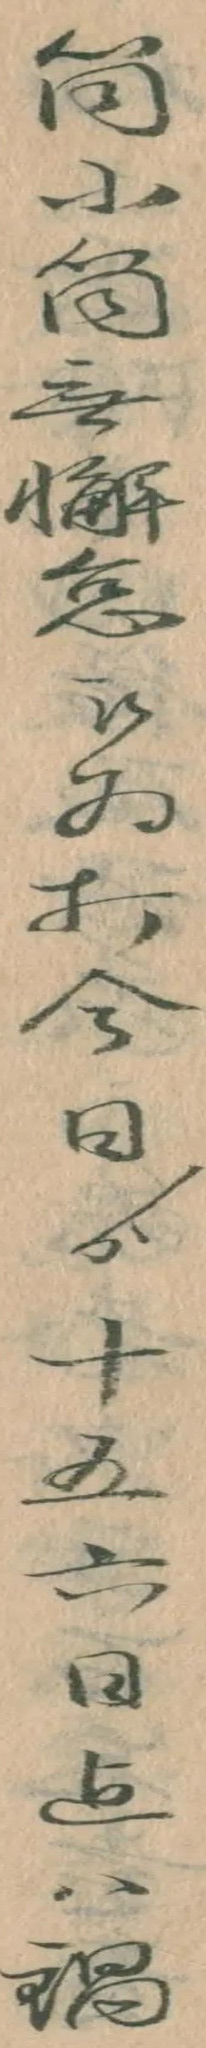筒小筒無懈怠被ゐ打今日ゟ十五六日迄は鍋
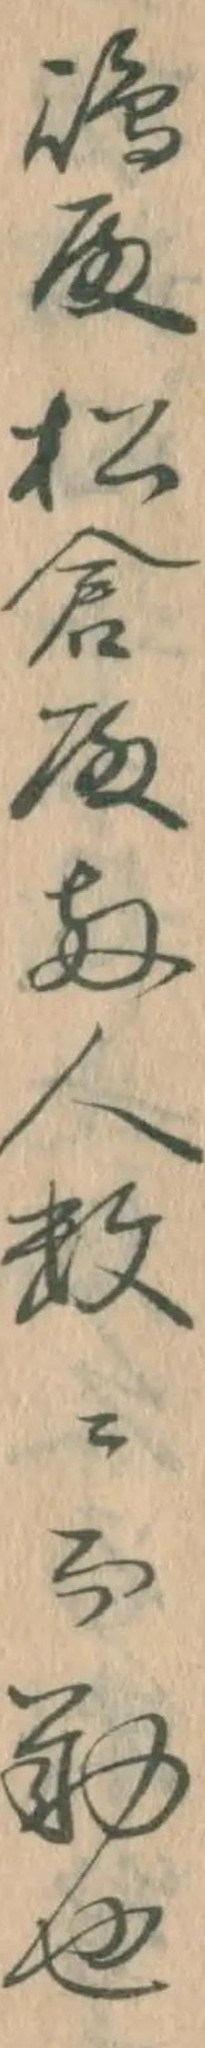島殿松倉殿両人数に而謹勤也
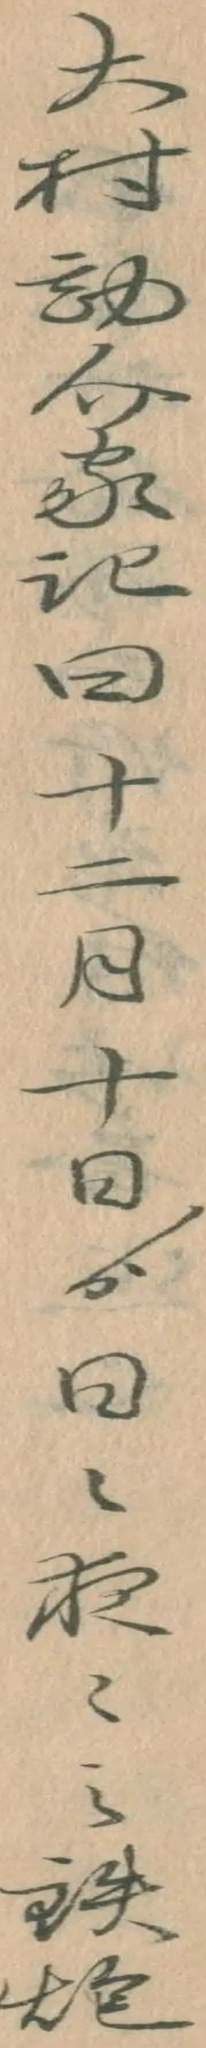大村勘介家記曰十二月十日ゟ日々夜々之鉄炮

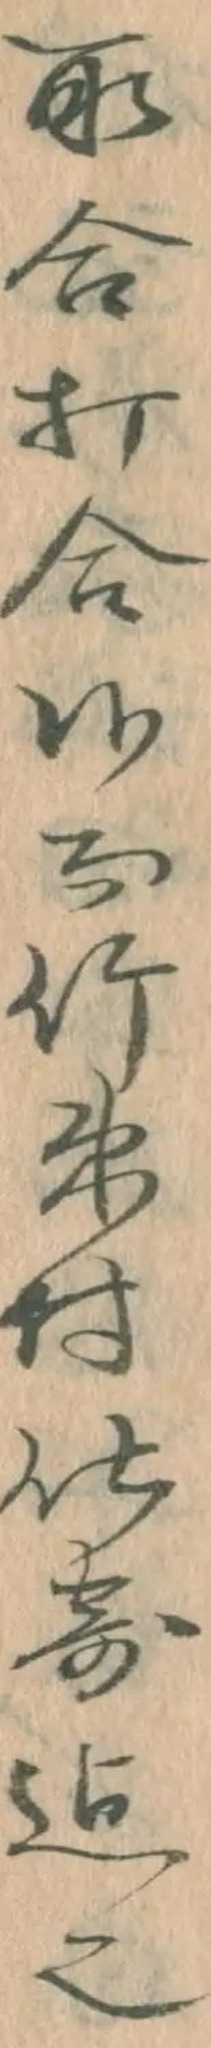取合打合候而竹束付仕寄迄也
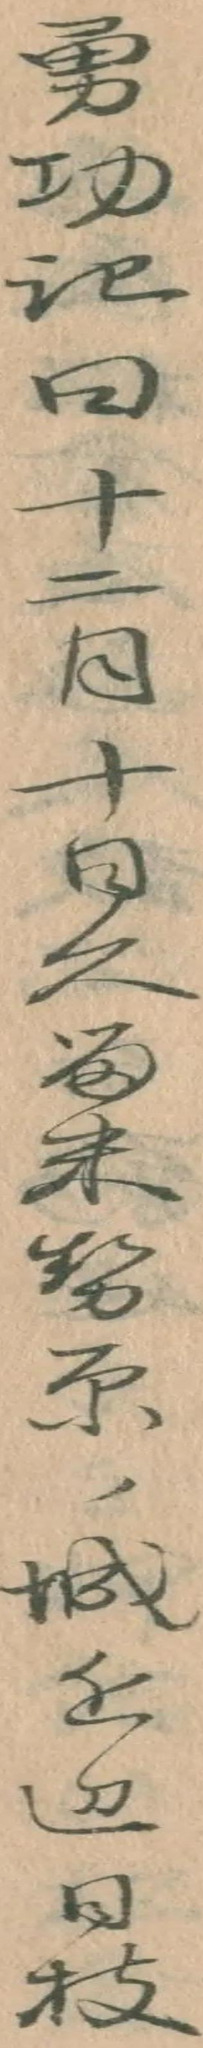勇功記曰十二月十日久留米勢原之城近辺日枝
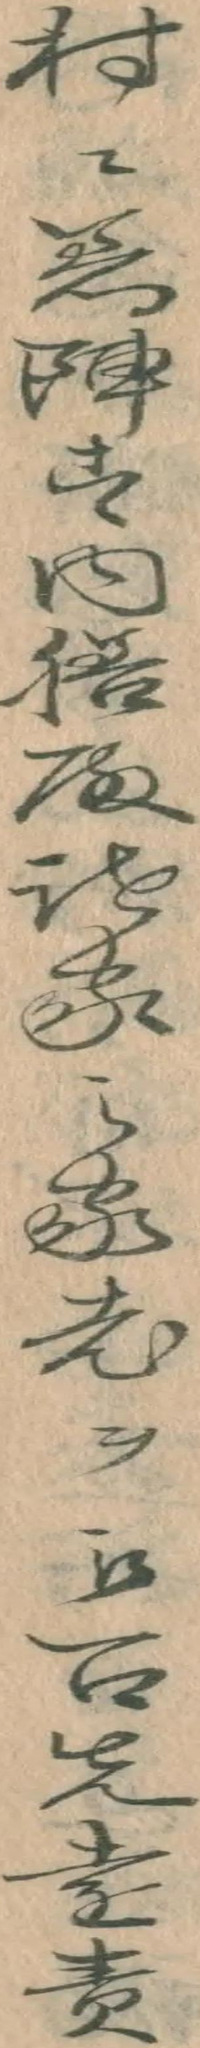村に着陣春内膳殿諸家之家老を被召先遠責
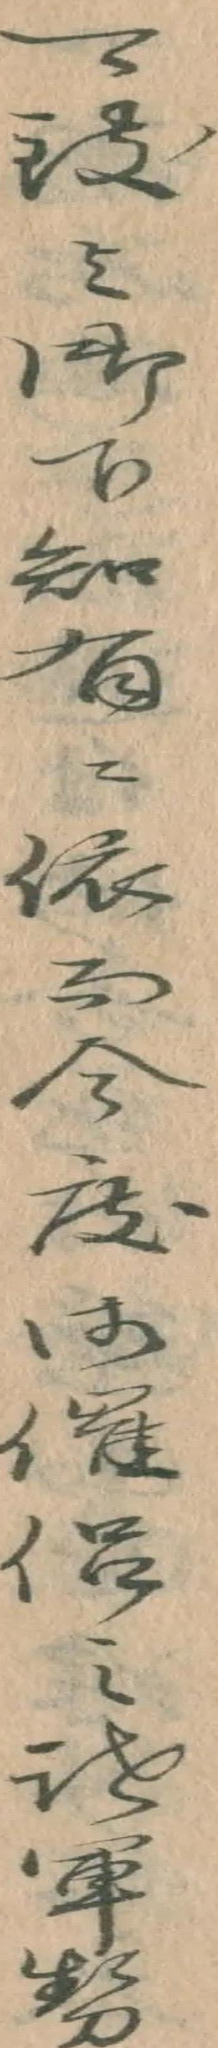可致与御下知有に依而今度御催侶之諸軍勢
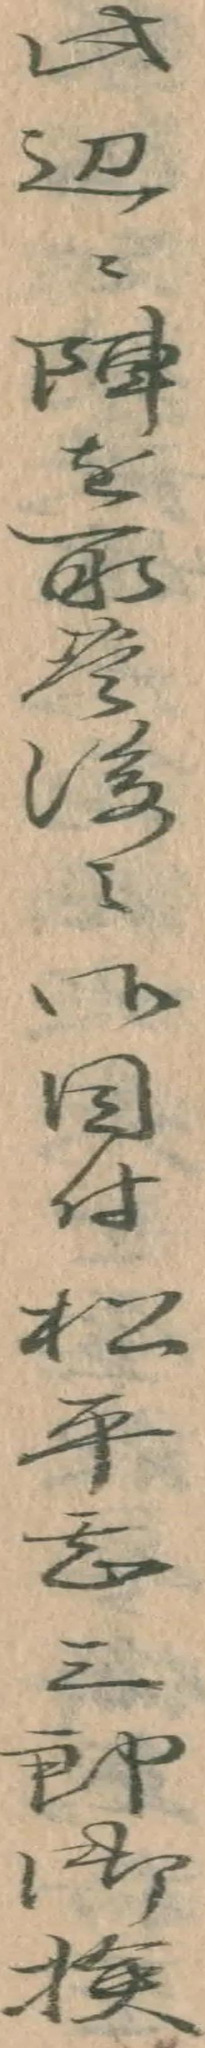此辺に陣を取豊後之御目付松平甚三郎御検
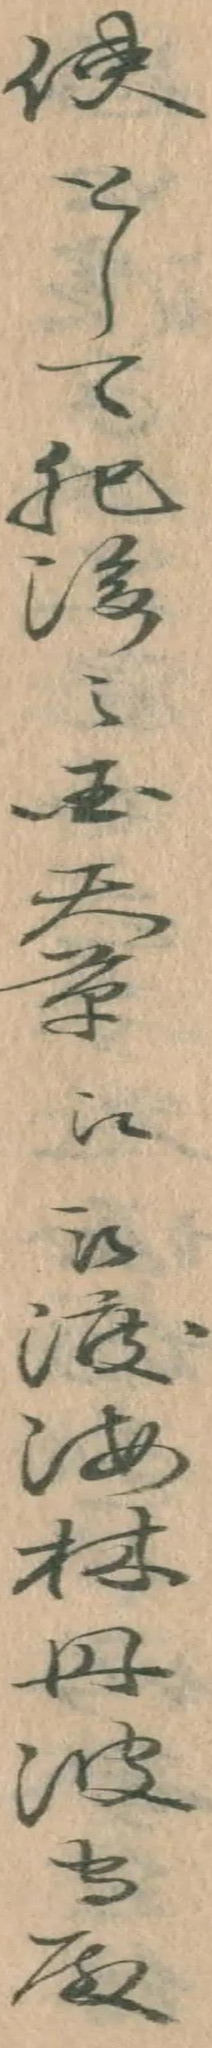使として肥後之国天草江被渡海林丹波守殿
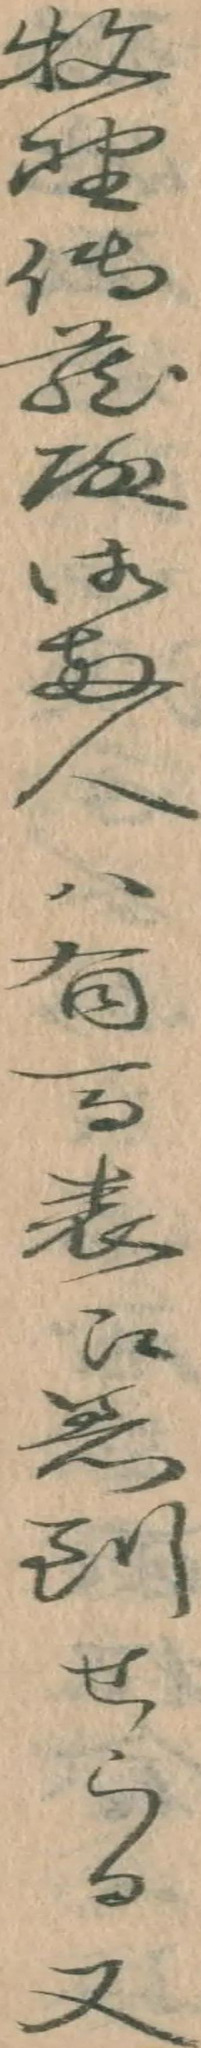牧野伝蔵殿御両人は有馬表江着到せらる又
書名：切支丹御退治記 49巻. [4]
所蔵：国立国会図書館 National Diet Library, JAPAN
